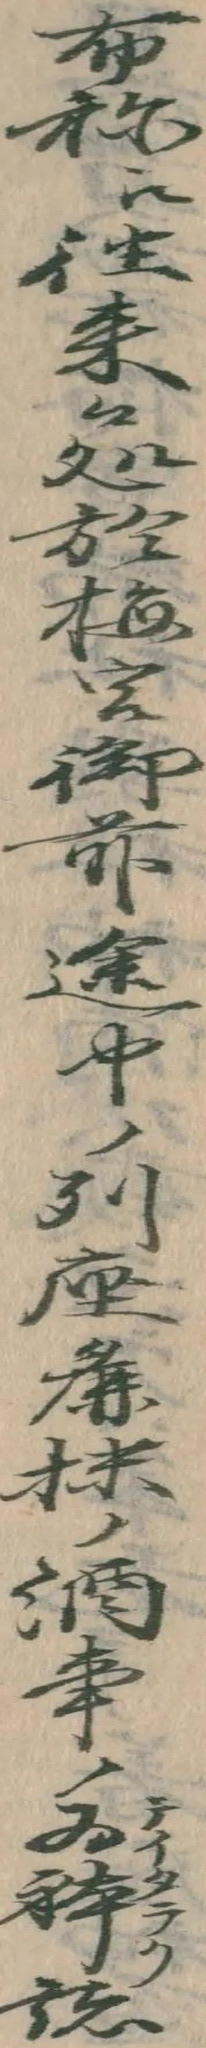布禰江往来候処於梅宮御前途中ノ列座麁抹ノ酒事ノ為体諸
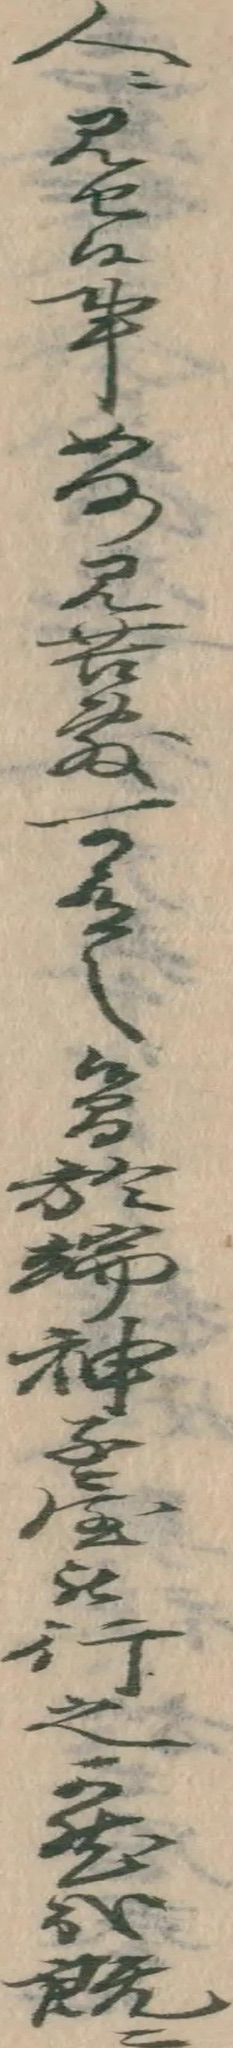人ニ見セ候事如何見苦敷可有之候間於端神子屋被行之可然哉既ニ
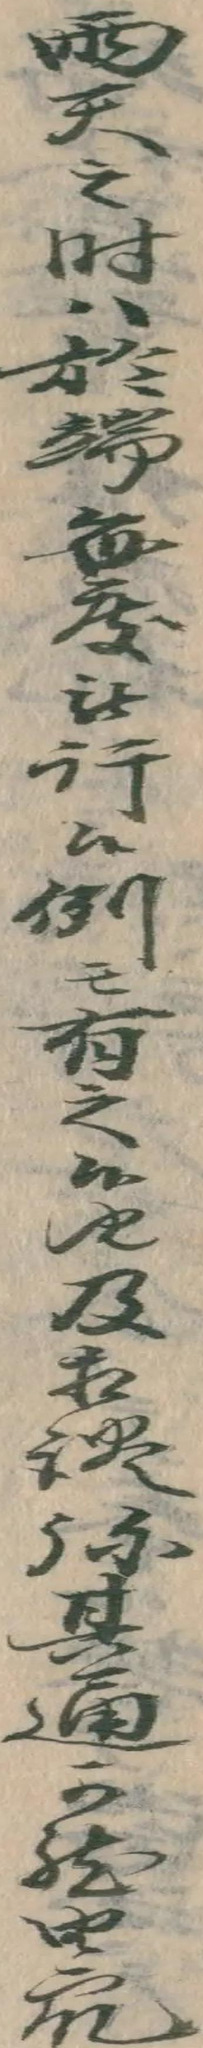雨天之時ハ於端毎度被行候例モ有之候由及相談弥其通可然由衆
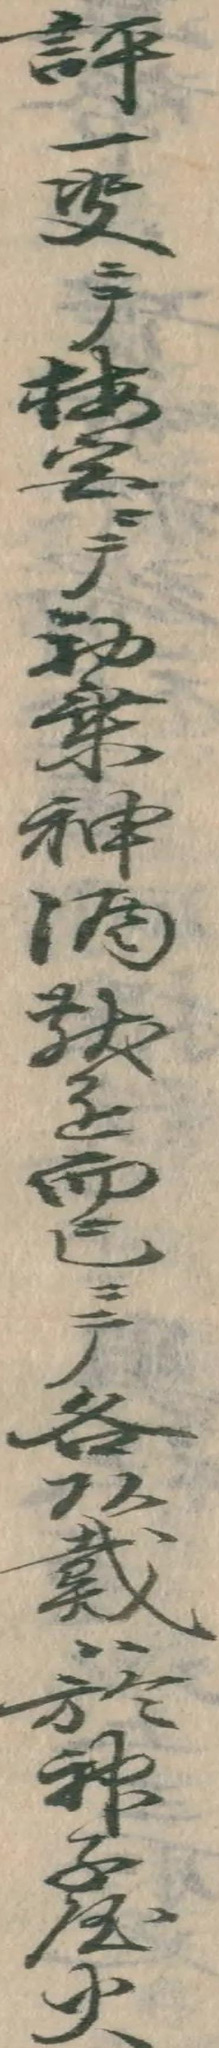評一決ニテ梅宮ニテ初乗神酒献進而已ニテ各頂戴ハ於神子屋火
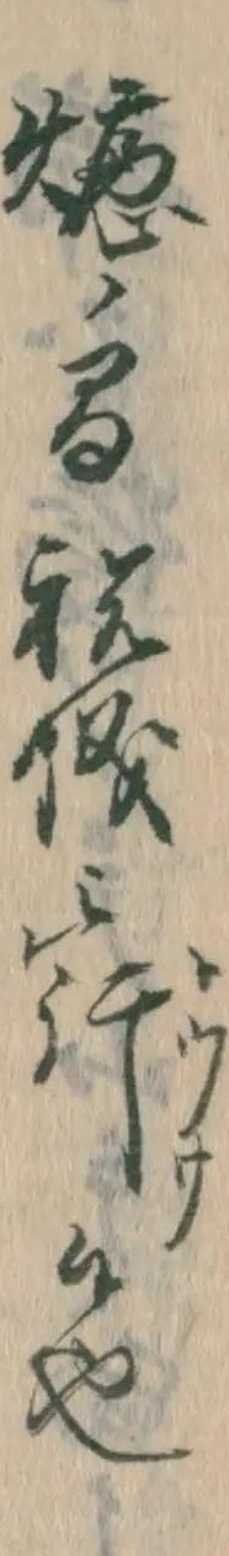爐ノ間祝儀被行候也
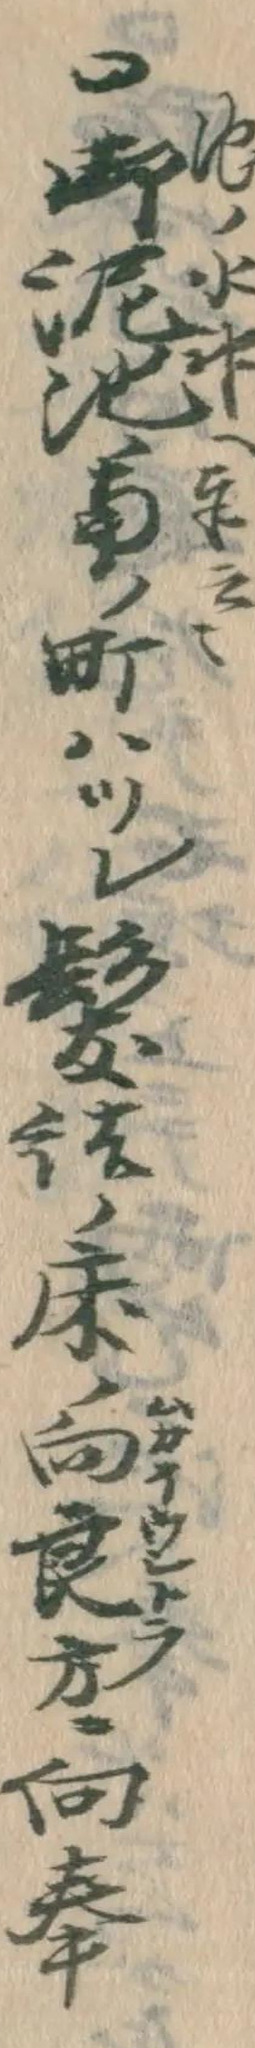○御泥池南ノ町ハツレ髪詰ノ床ノ向良方ニ向奉
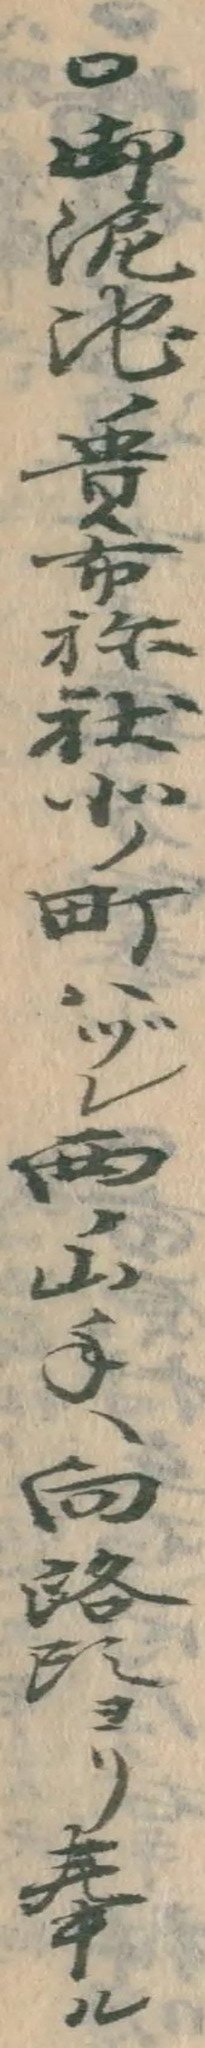○御泥池ノ貴布禰社北ノ町ハヅレ西ノ山手へ向路頭ヨリ奉ル

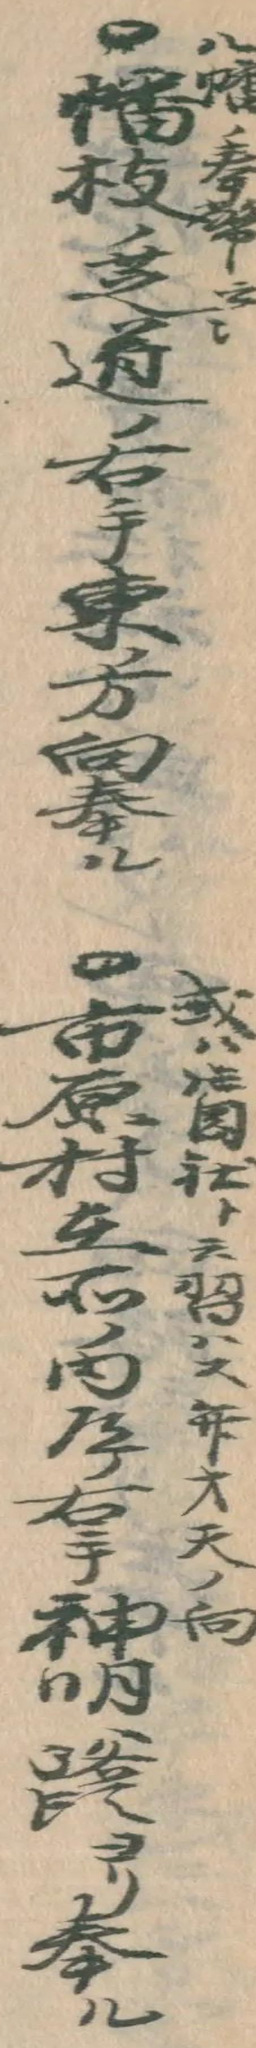○幡枝ノ芝道ノ右手東ノ方向奉ル○市原村在所ノ内道ノ右手神明へ路頭ヨリ奉ル
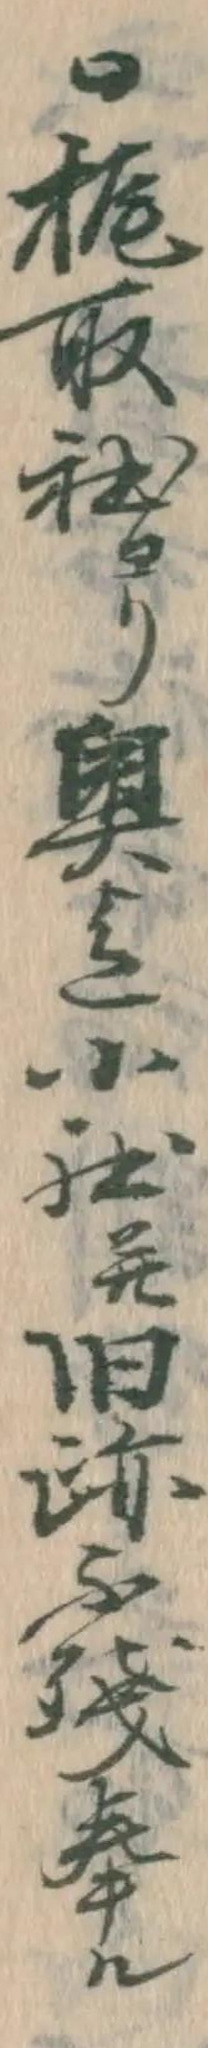○梶取社ヨリ奥迄小社并旧跡不残奉ル
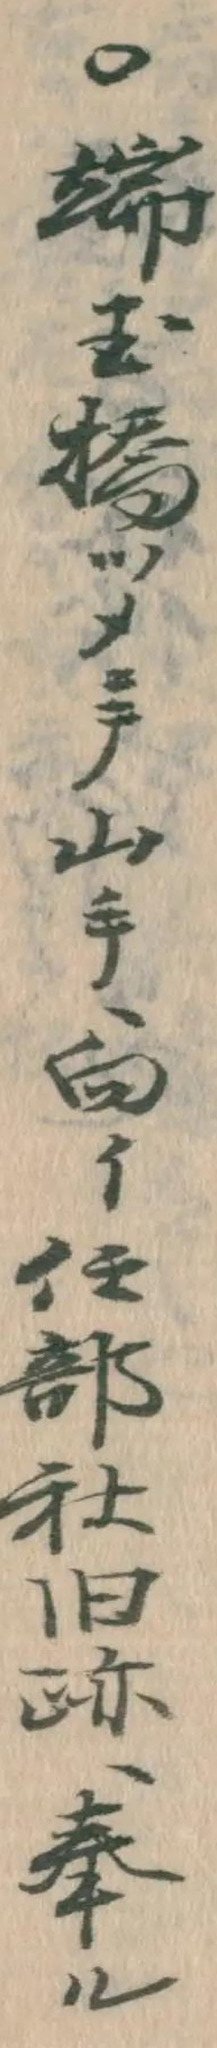○端玉橋ツメニテ山手へ向イ任部社旧跡へ奉ル
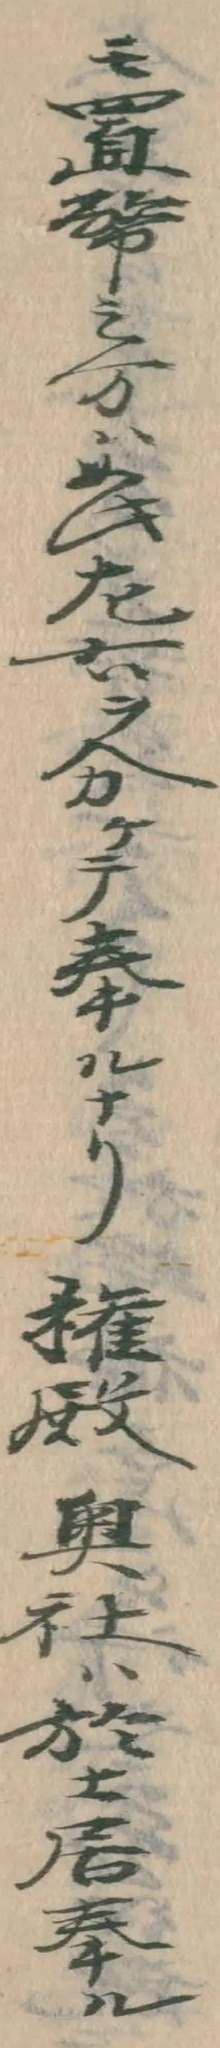モ置幣三方ハ如此左右ヲ分ケテ奉ルナリ権殿奥社ハ於土居奉ル
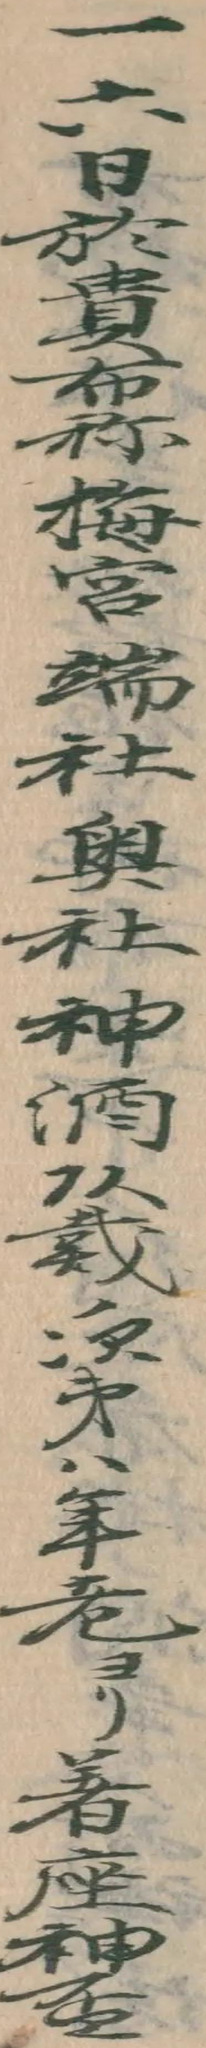一六日於貴布禰宜梅宮瑞社奥社神酒頂戴ノ次第ハ年老ヨリ着座神盃
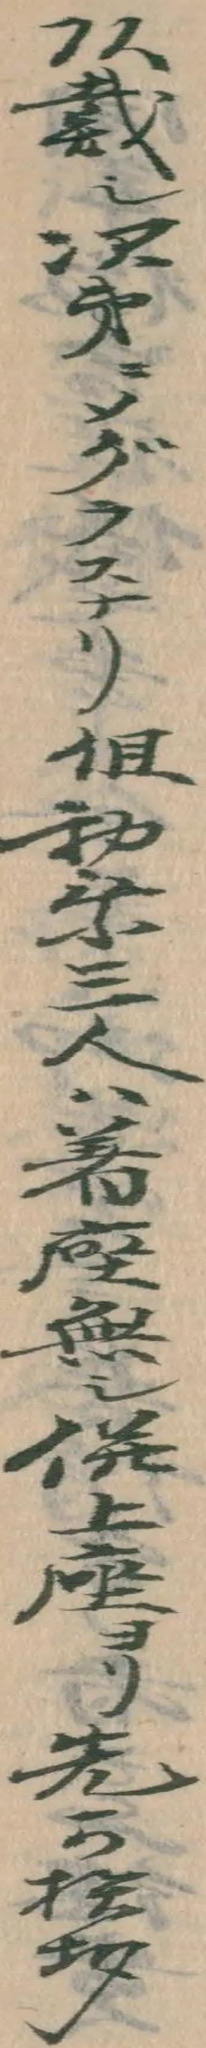頂戴シ次第ニメグラスナリ但初乗三人ハ着座無シ併上座ヨリ先可挨拶
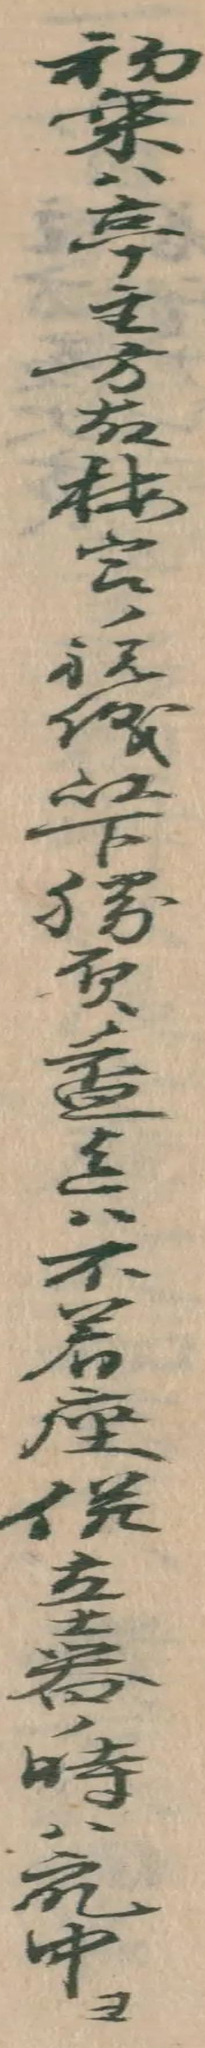初乗ハ亭主方故梅宮ノ祝儀以下勝負ノ盃迄ハ不着座併立土器ノ時ハ衆中ヨ
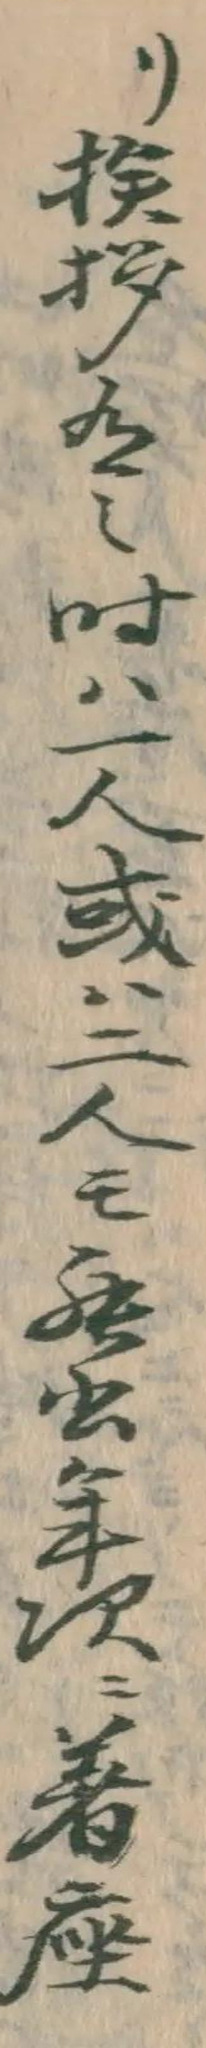リ挨拶有之時ハ一人或ハ二人モ罷出年次ニ着座
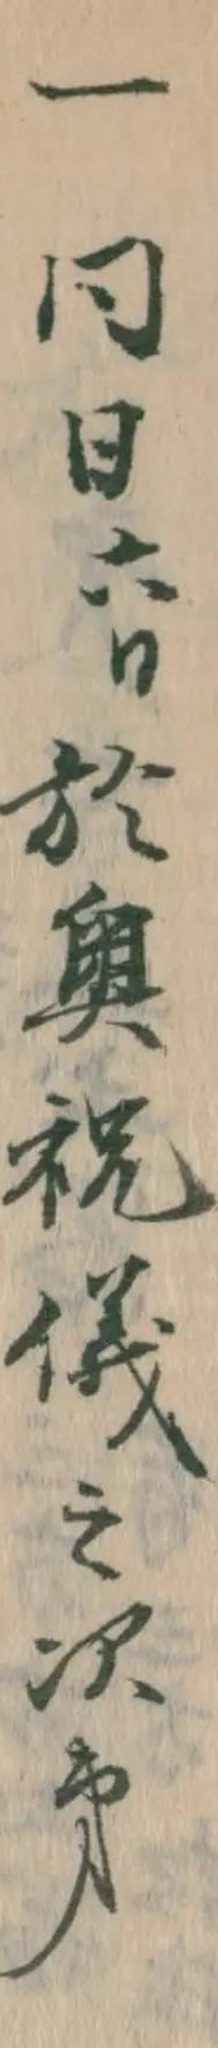一同日六日於奥祝儀之次第
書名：賀茂社記録. 第11冊
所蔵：国立国会図書館 National Diet Library, JAPAN
